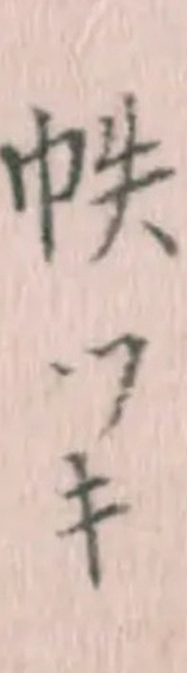帙ツキ

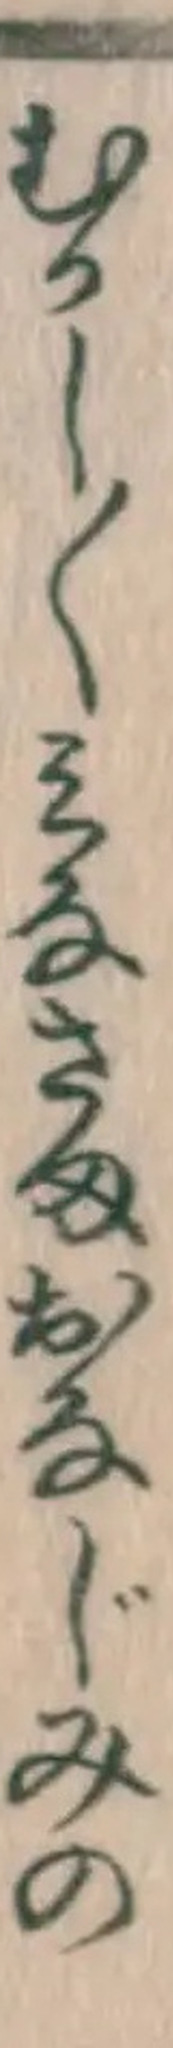むかし〳〵みなさまおなじみの
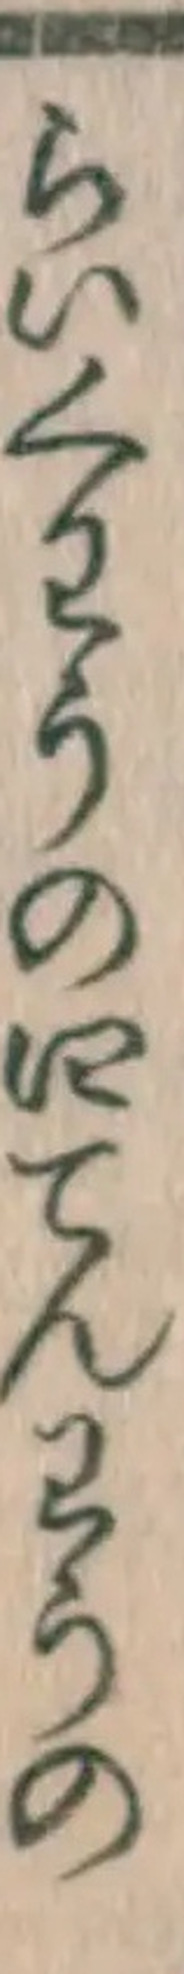らいくわうの四てんわうの
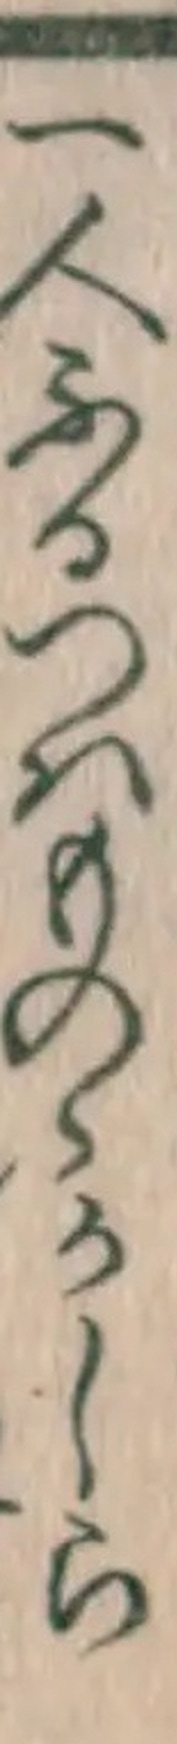一人ふるつはものゝかしら
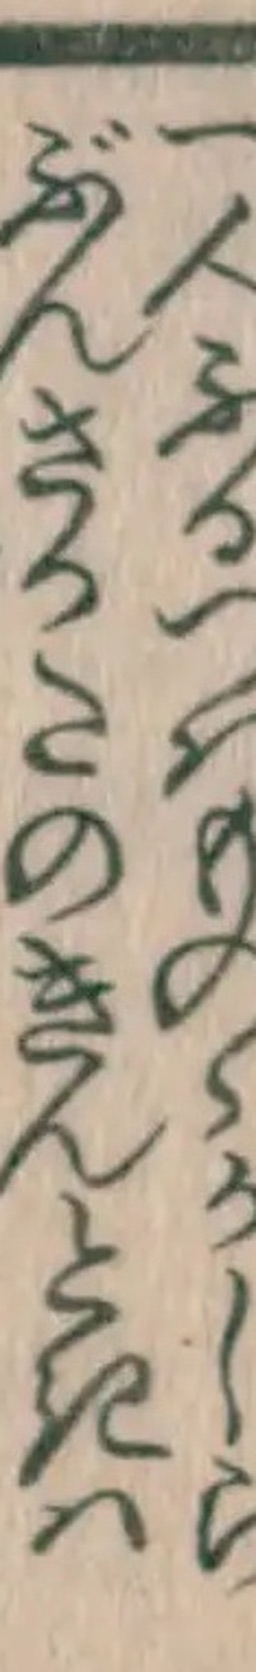ぶんさかたのきんときは
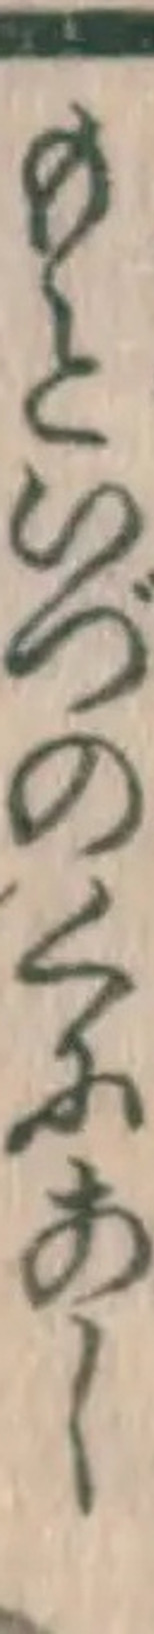もといづのくにあし
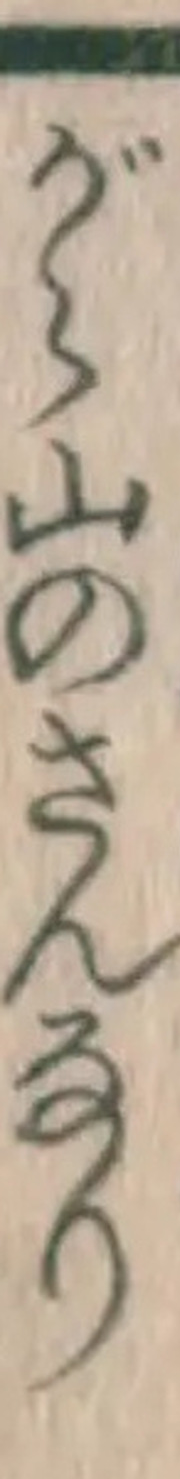がら山のさんなり
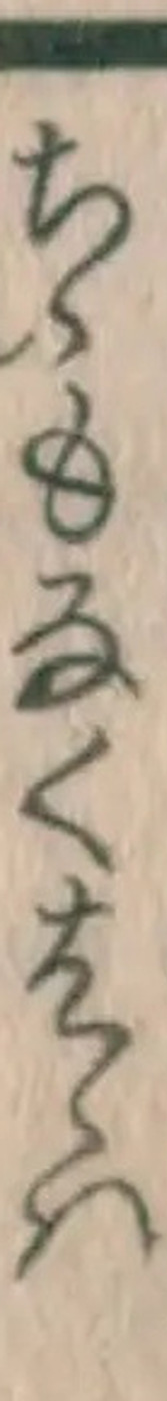ちゝもなくはゝは
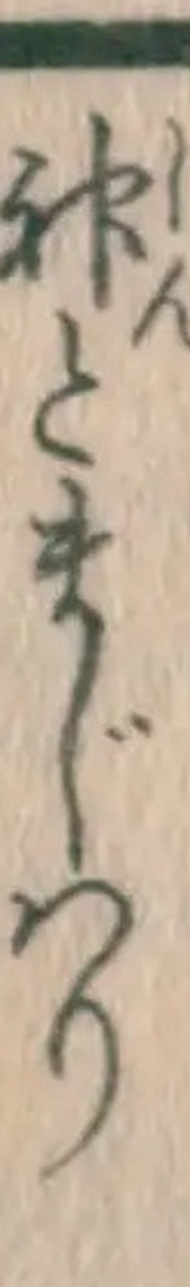神とまじはり
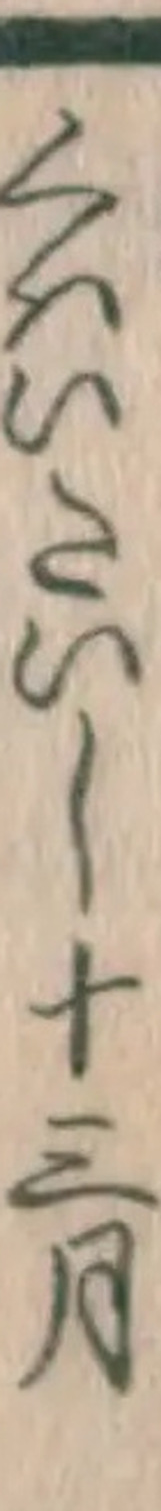くはいたいし十三月
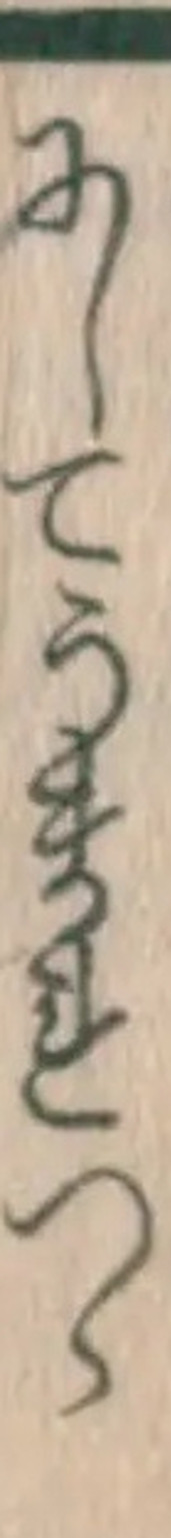にしてうまれつゝ
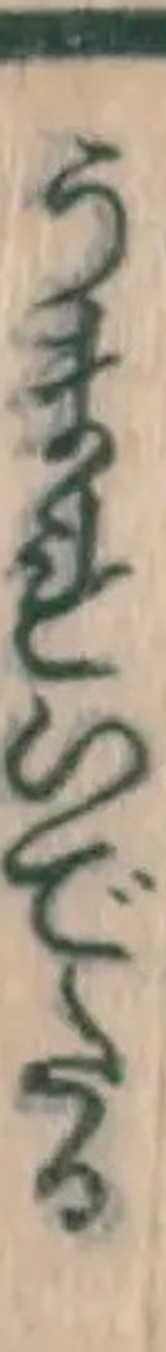うまれいでたる
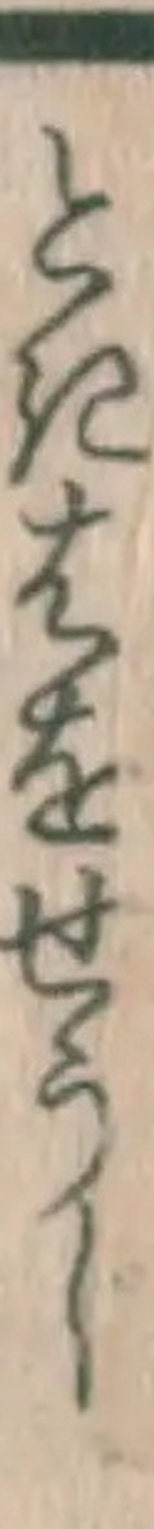ときはをせうし
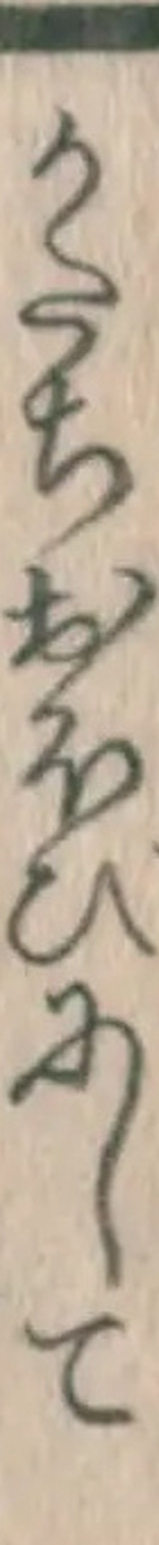かたちおほひにして
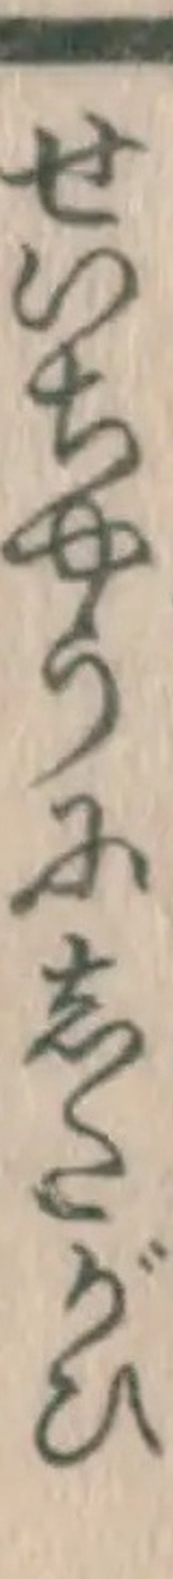せいちやうにしたがひ
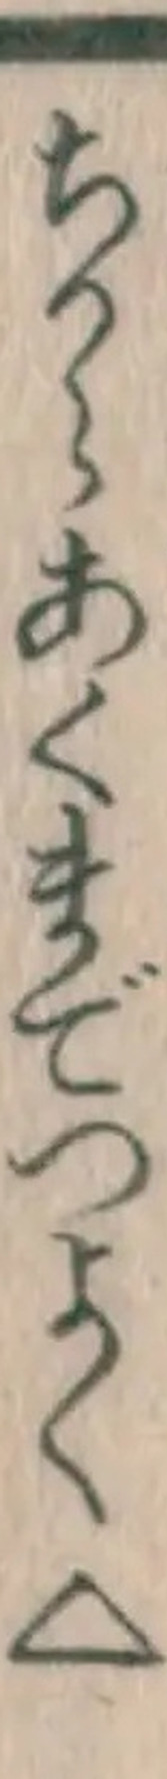ちからあくまでつよく△
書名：金太郎
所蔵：国立国会図書館 National Diet Library, JAPAN
